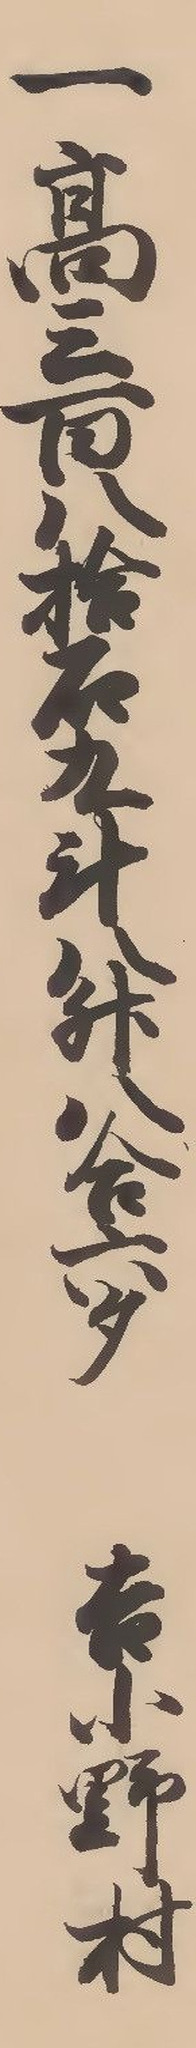一高三百八拾石九斗八升八合六勺吉小野村
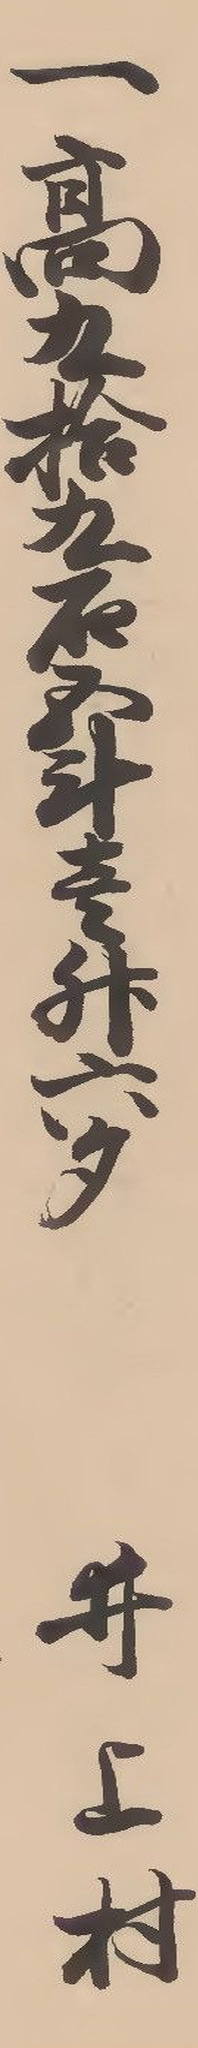一高九拾九石五斗壱升六勺井上村
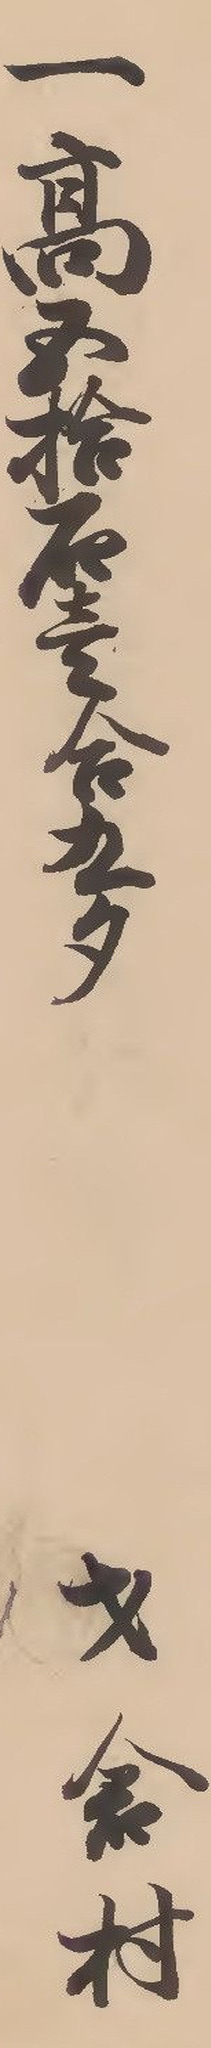一高五拾石壱合九勺才倉村

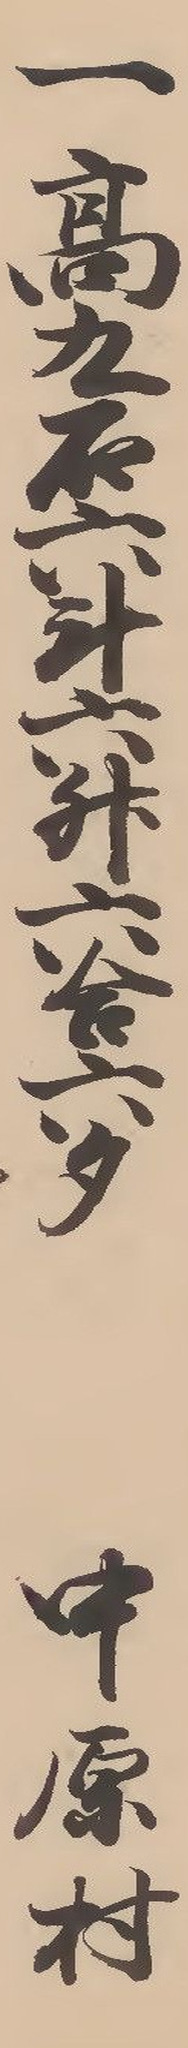一高九石六斗六升六合六勺中原村
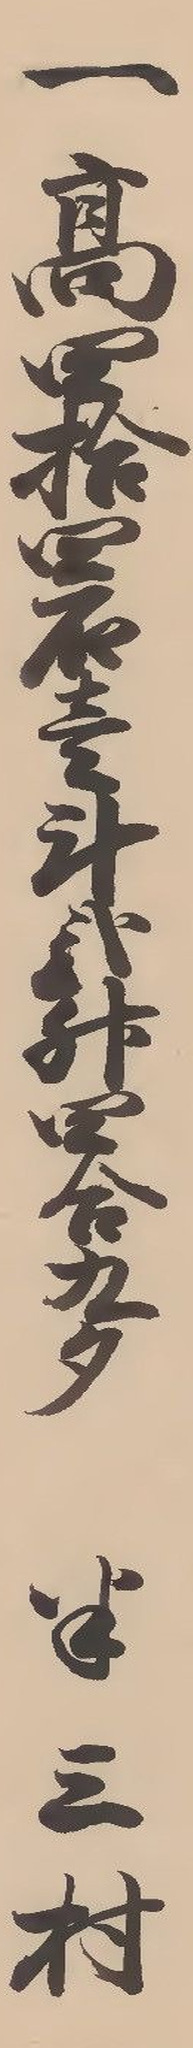一高四拾四石壱斗弐升四合九勺半三村
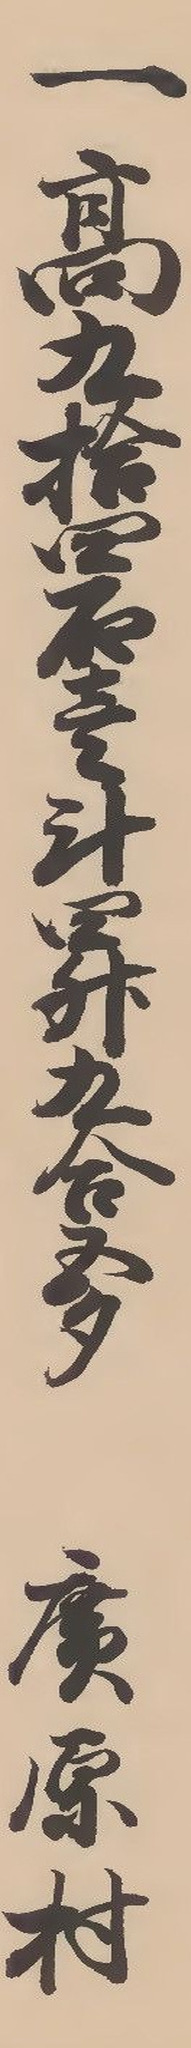一高九拾四石壱斗四升九合五勺広原村
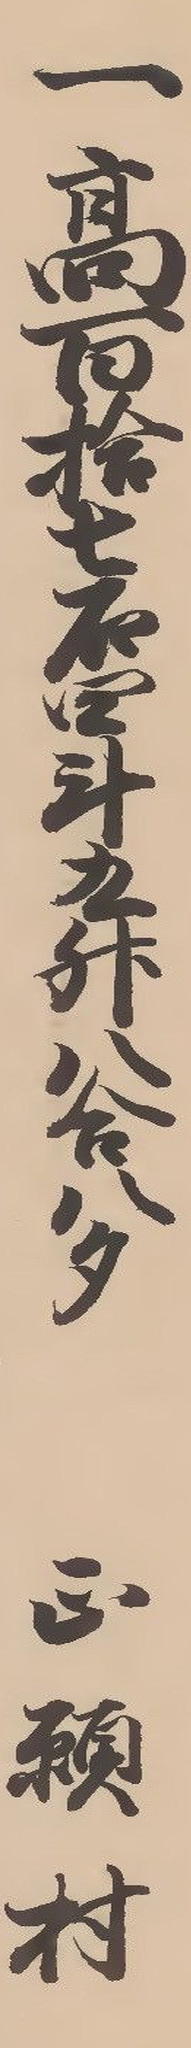一高百拾七石四斗九升八合八勺正願村
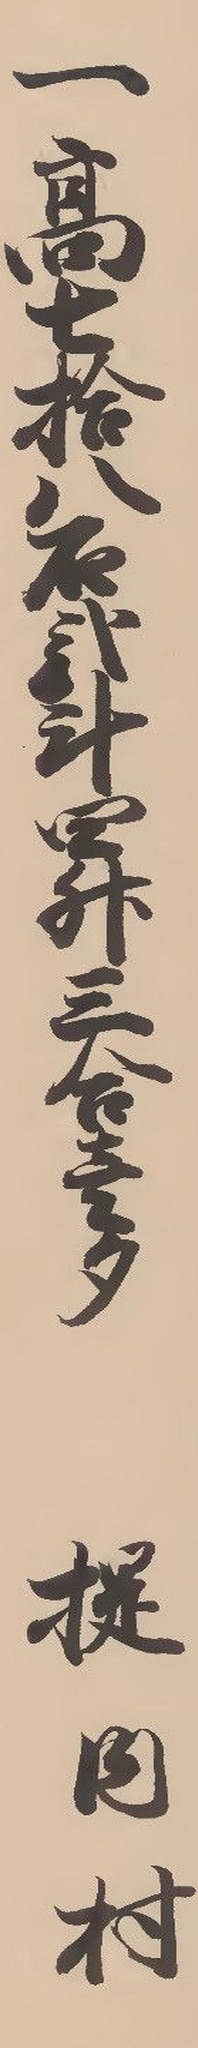一高七拾八石弐斗四升三合壱勺提内村
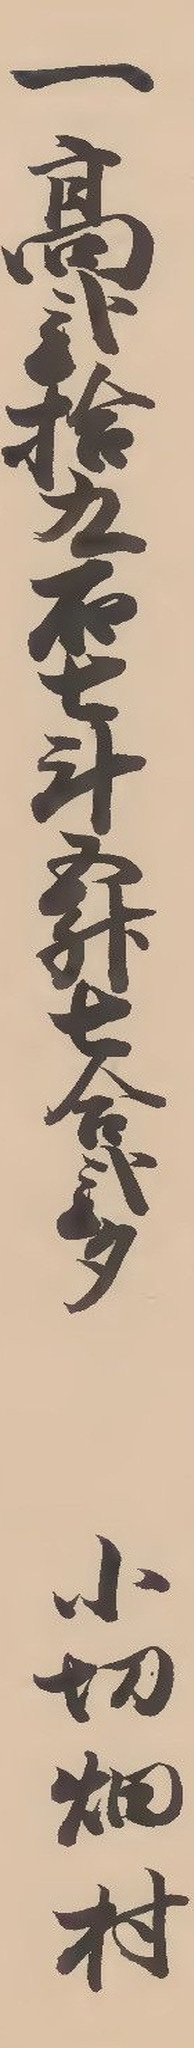一高弐拾九石七斗五升七合弐勺小切畑村
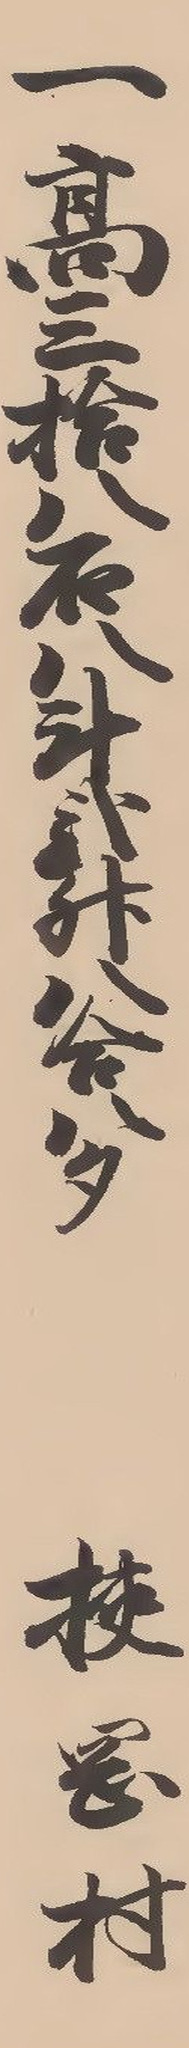一高三拾八石八斗弐升八合八勺挟岡村
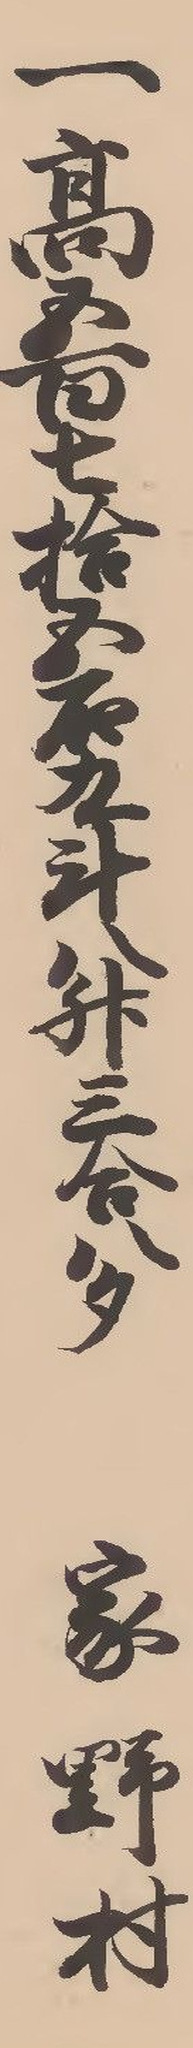一高五百七拾五石九斗八升三合八勺家野村

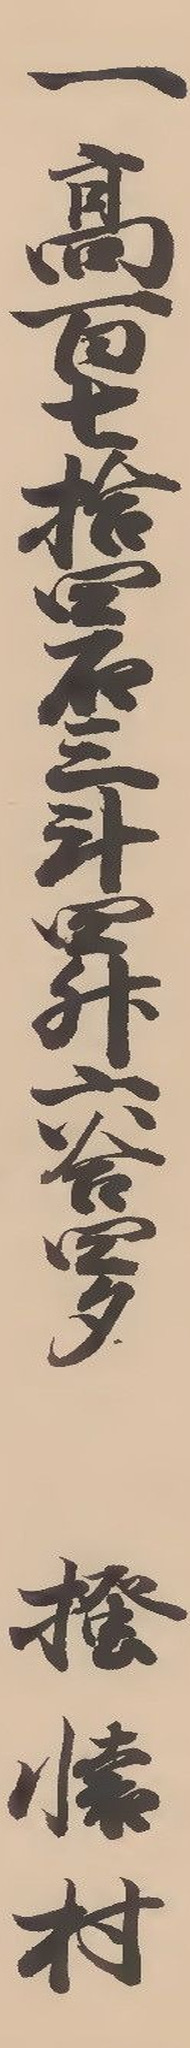一高百七拾四石三斗四升六合四勺掻懐村
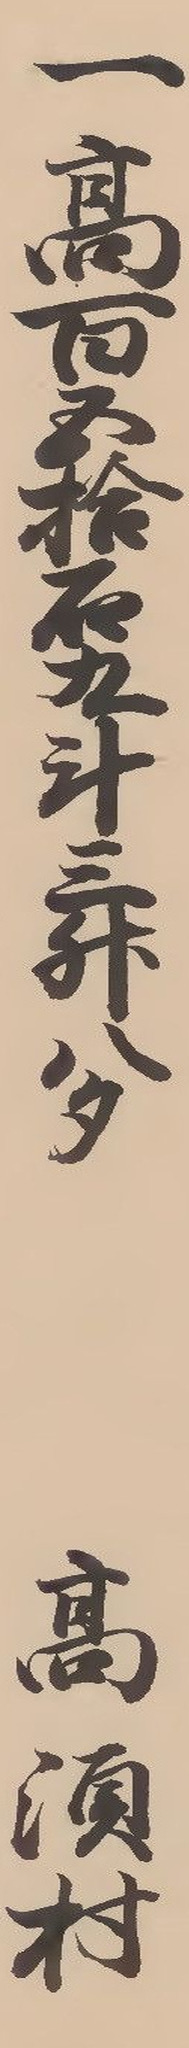一高百五拾石九斗三升八勺高須村
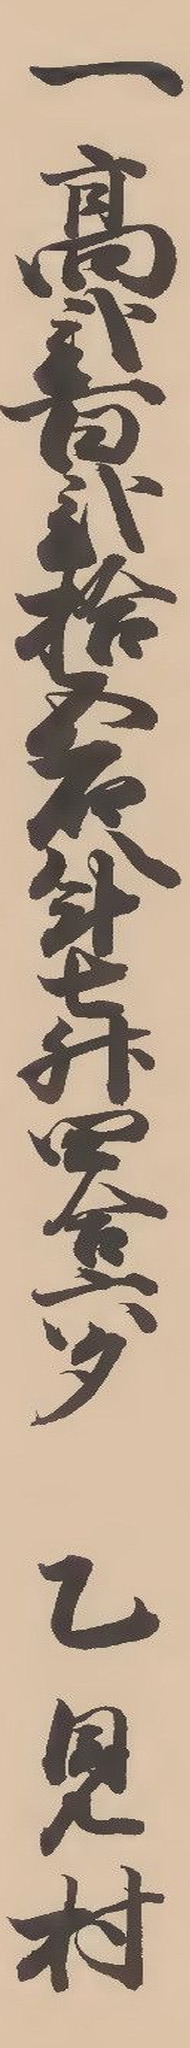一高弐百弐拾五石八斗七升四合六勺乙見村
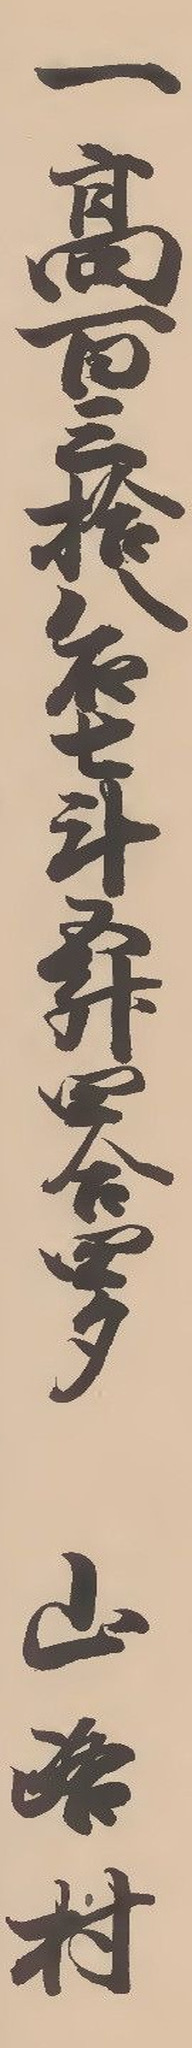一高百三拾八石七斗五升四合四勺山路村
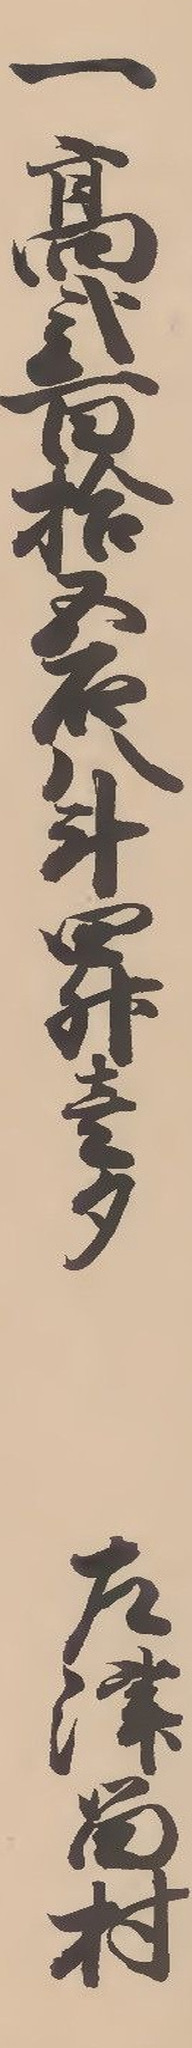一高弐百拾五石八斗四升壱勺左津留村
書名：豊後国郷帳
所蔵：国立公文書館 National Archives of Japan
